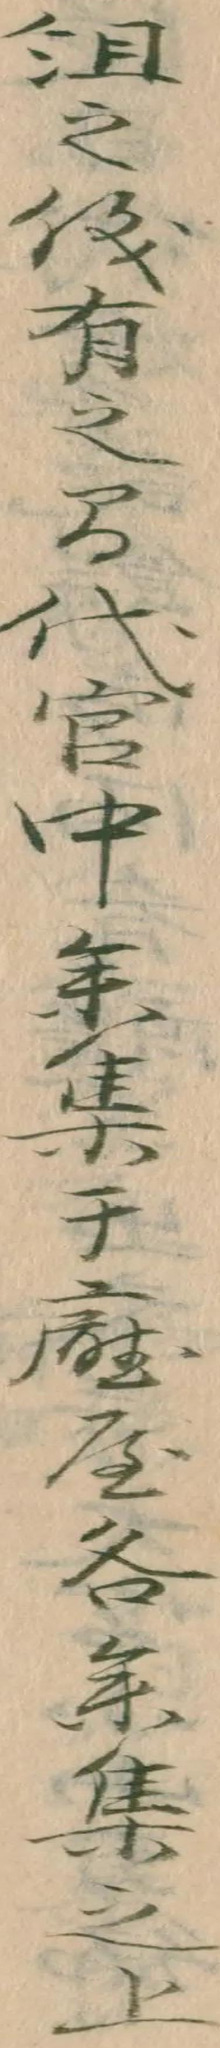組之儀有之間代官中参集于庁屋各参集之上
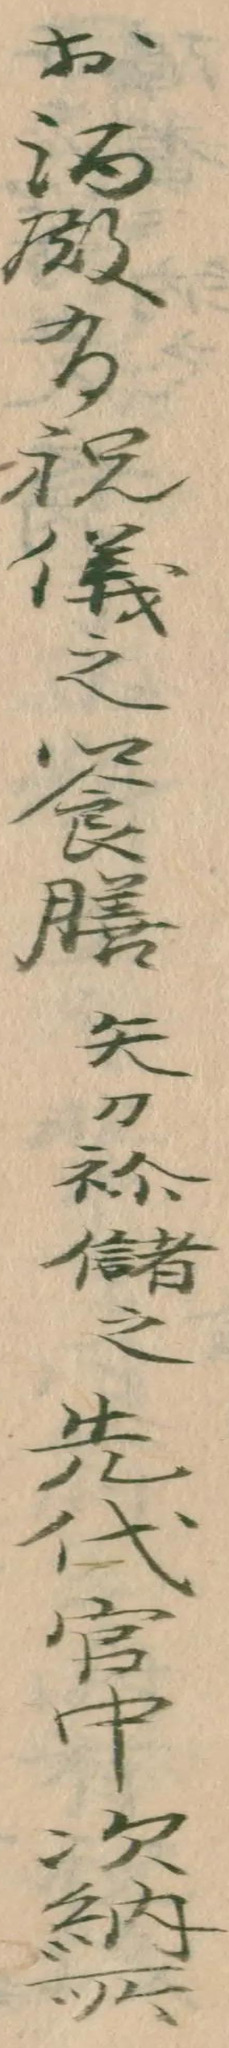於酒殿有祝儀之饗膳矢刀祢儲之先代官中次納所
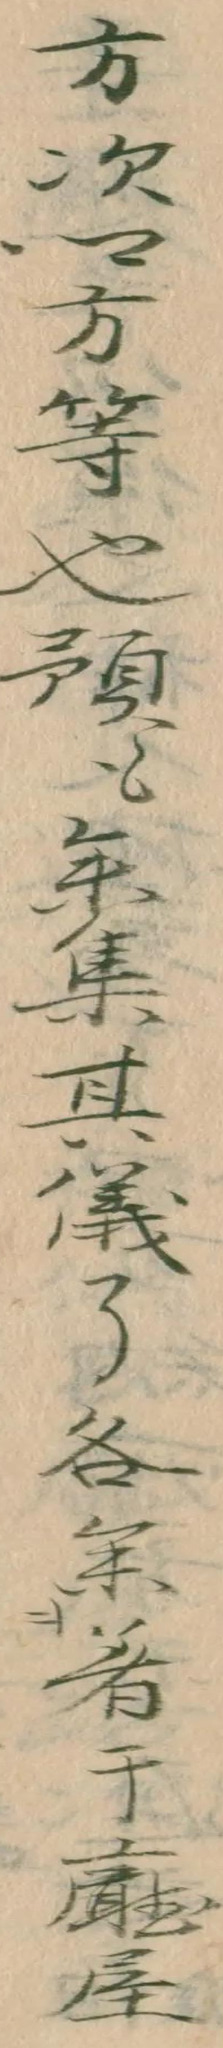方次郷方等也預も参集其儀了各参-着于庁屋
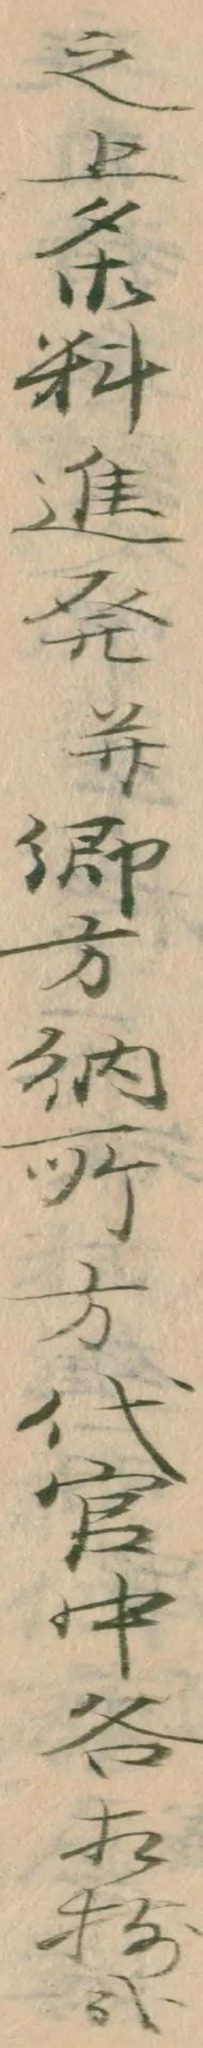之上夕御料進発并郷方納所方代官中各相揃哉
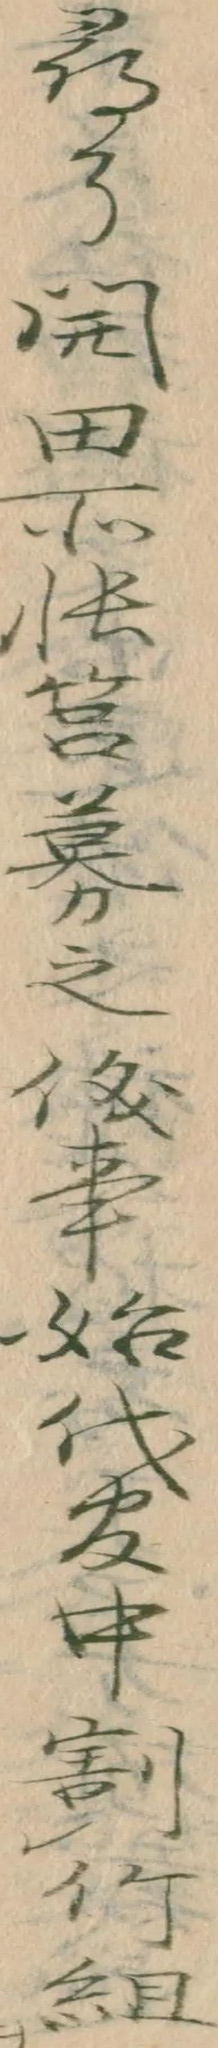尋了開田所帳筥募之儀事始代官中割竹組-
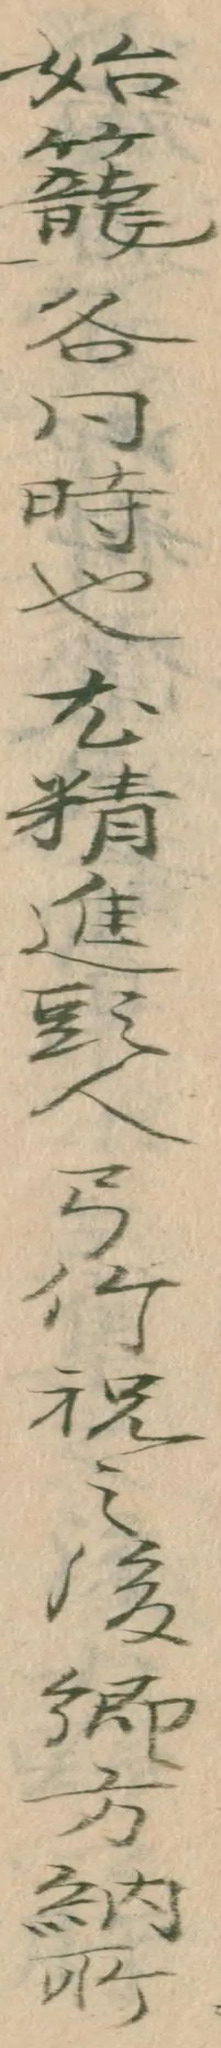始籠各同時也尤精進頭人弓竹祝之後郷方納所
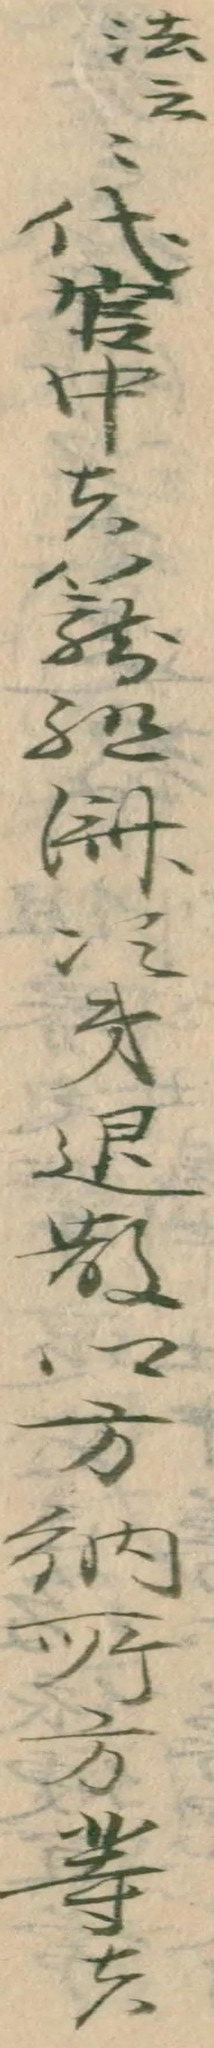法云々代官中は籠組済次第退散郷方納所方等は

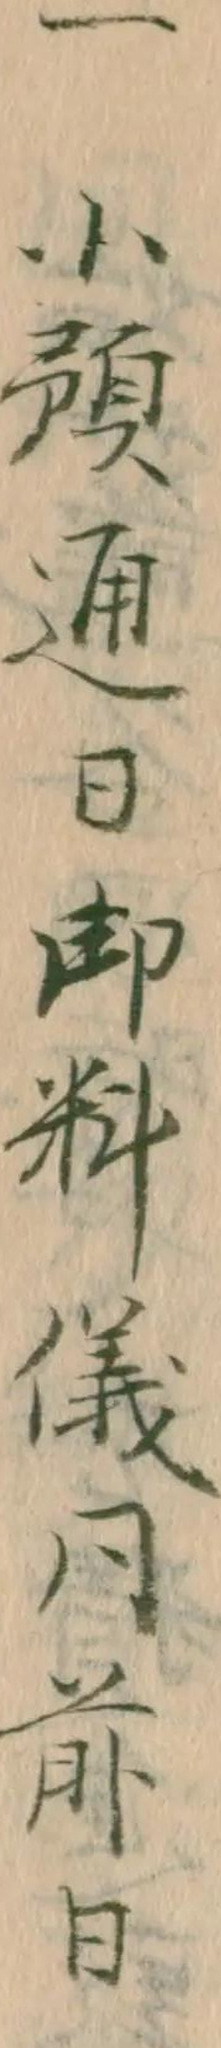一小預通日御料儀同前日
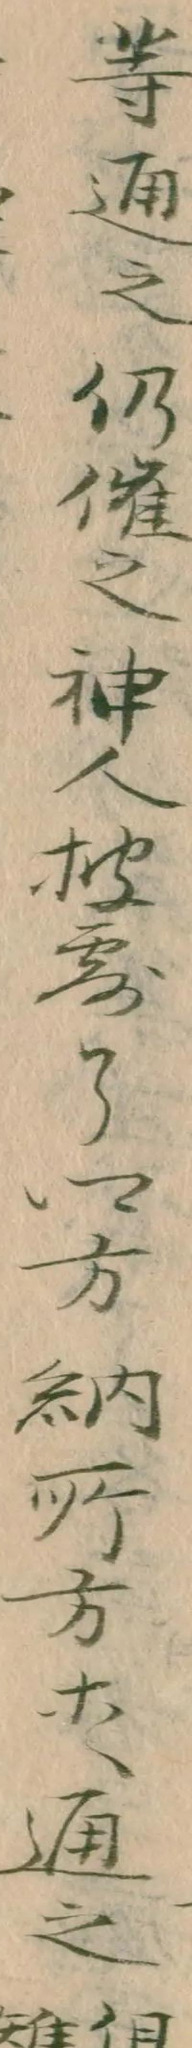等通之仍催之神人披露了郷方納所方等へ通之但雉
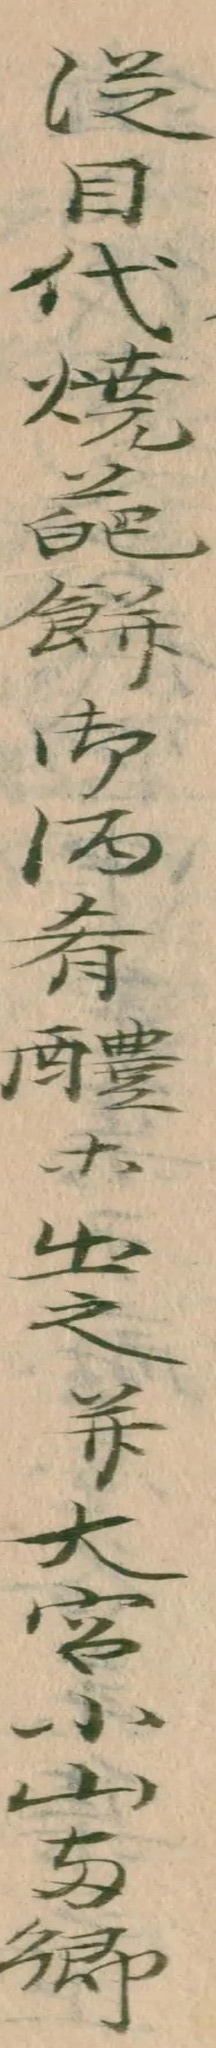一従目代焼葩餅御酒肴醴等出之并大宮小山両郷
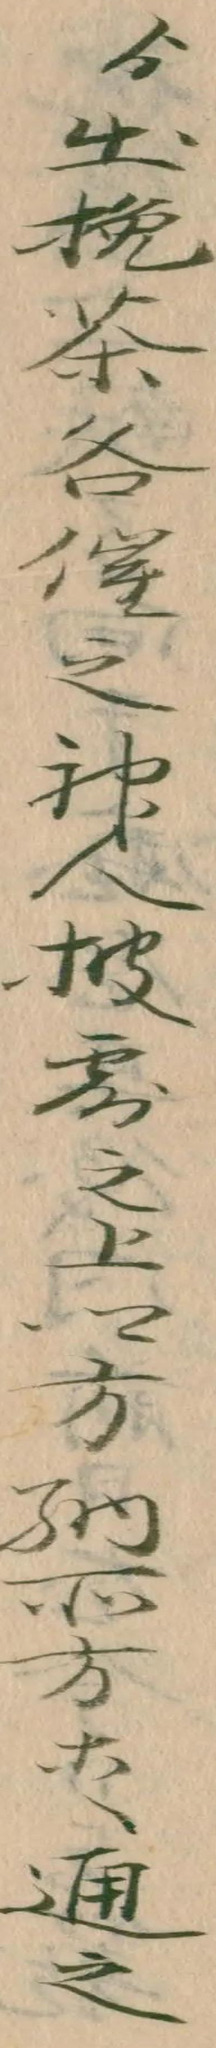ゟ出挽茶各催之神人披露之上郷方納所方等へ通之
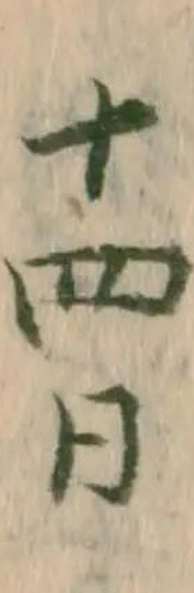十四日
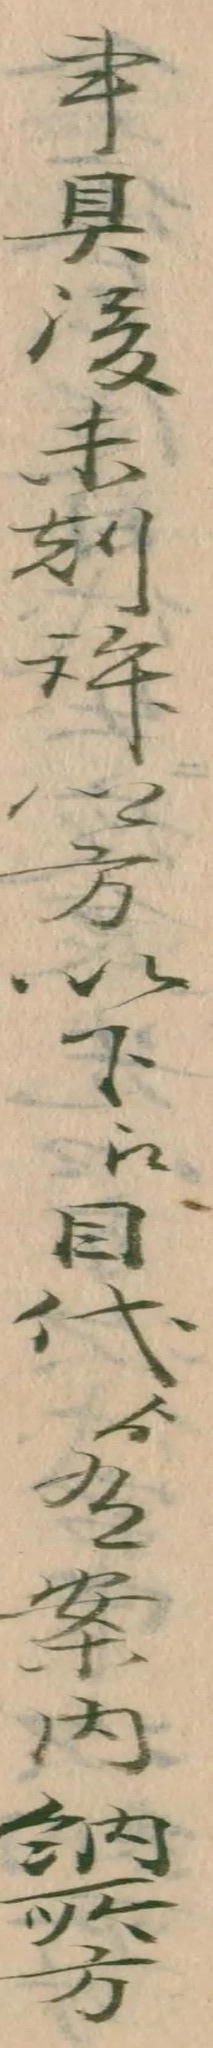事具後未刻許郷方以下え目代ゟ有案内納所方
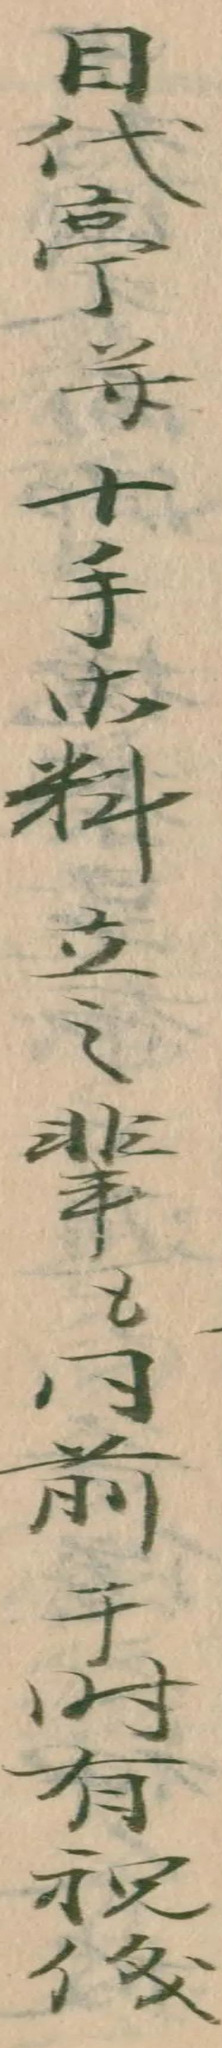目代亭并十手御料立之輩も同前于時有祝儀
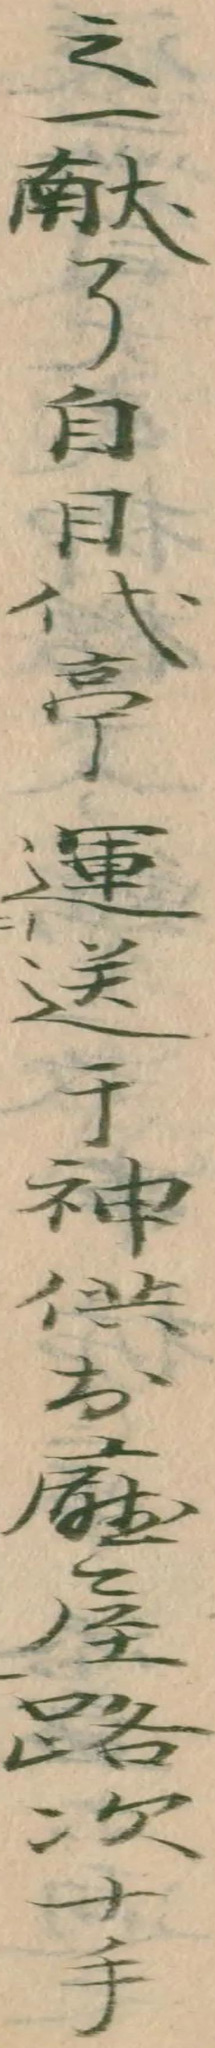之一献了自目代亭運-送于神供於庁屋路次十手
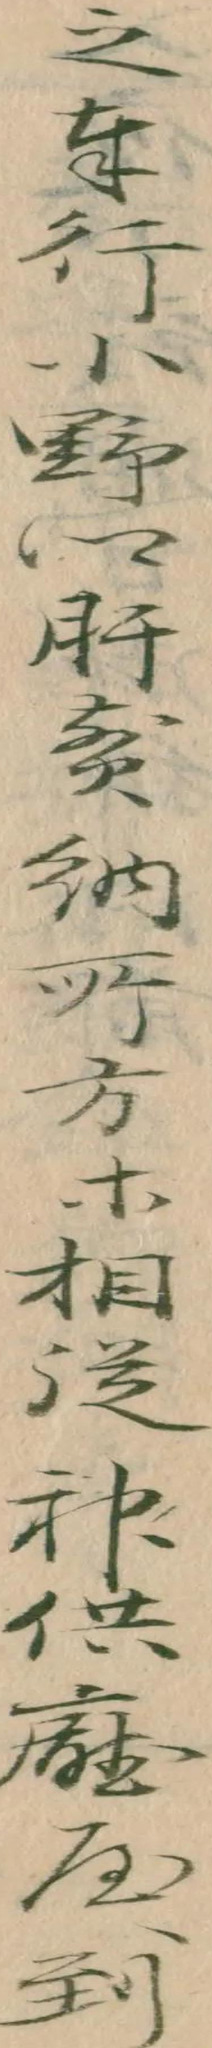之奉行小野郷肝煎納所方等相従神供庁屋へ到
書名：賀茂社記録. 第26冊
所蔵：国立国会図書館 National Diet Library, JAPAN
